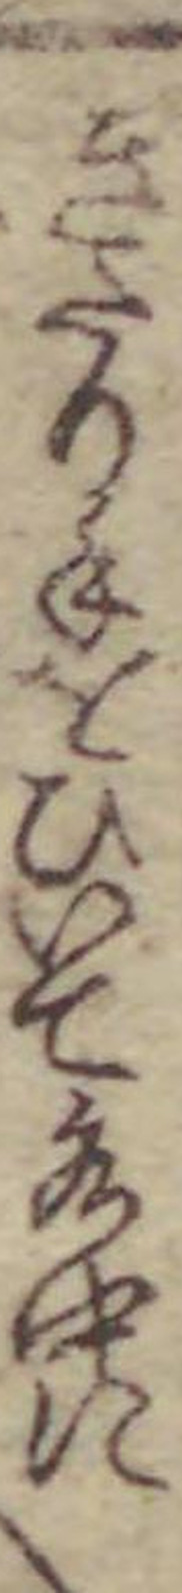きたり手をひいて水中に
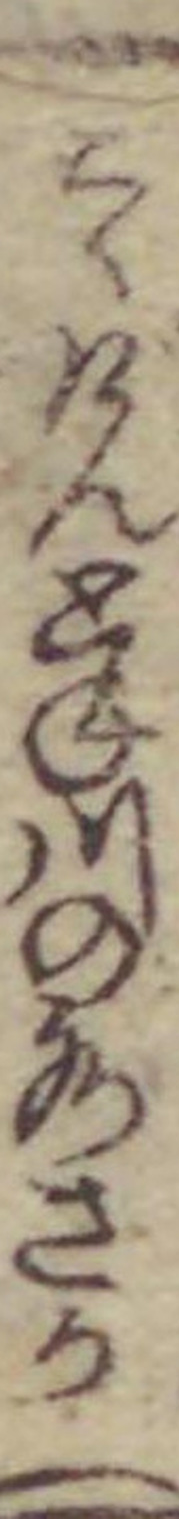こくげんとね川の水さか
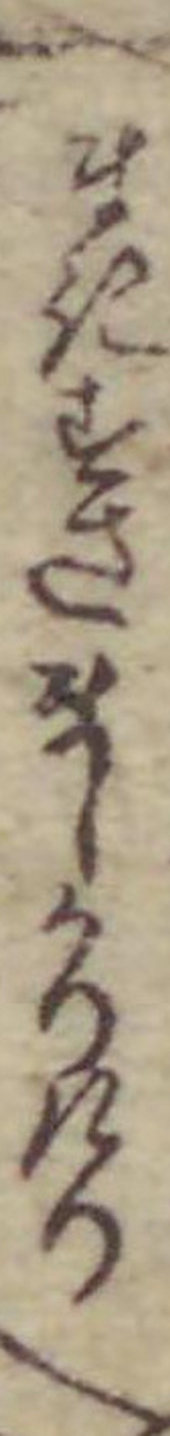まきすさましかりけり
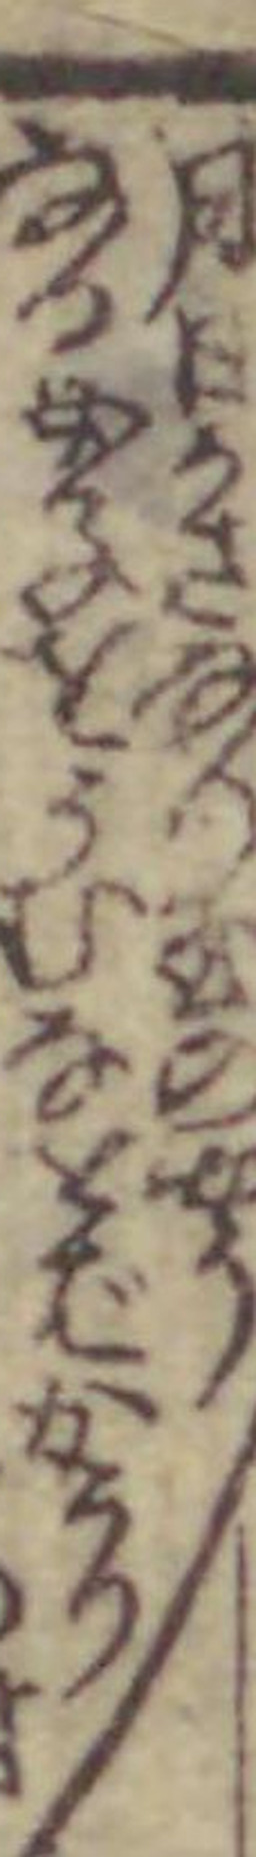なる女子をうむなをばかとり
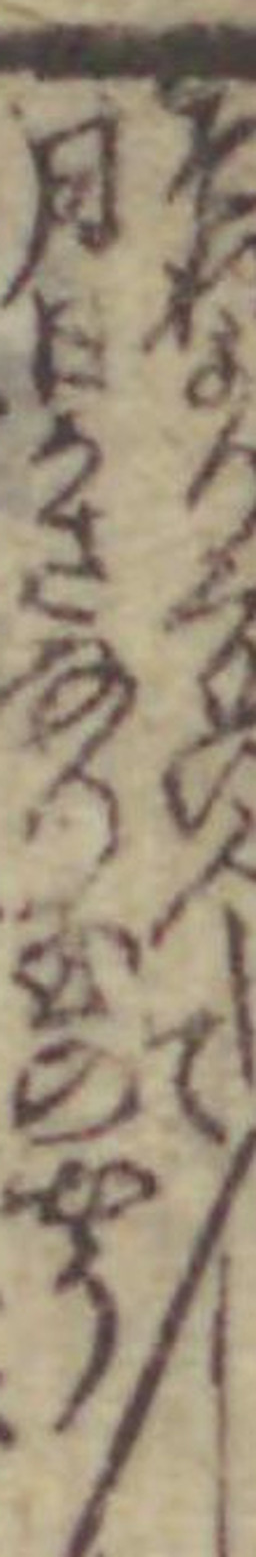月日かさなり玉のやう
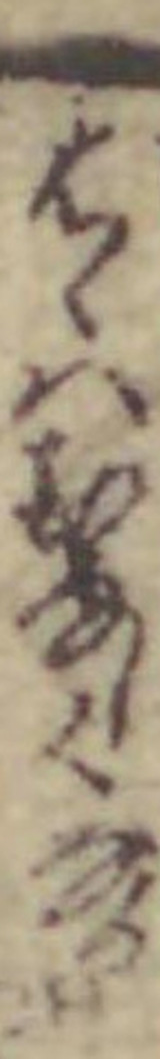はゝはむなしくなる
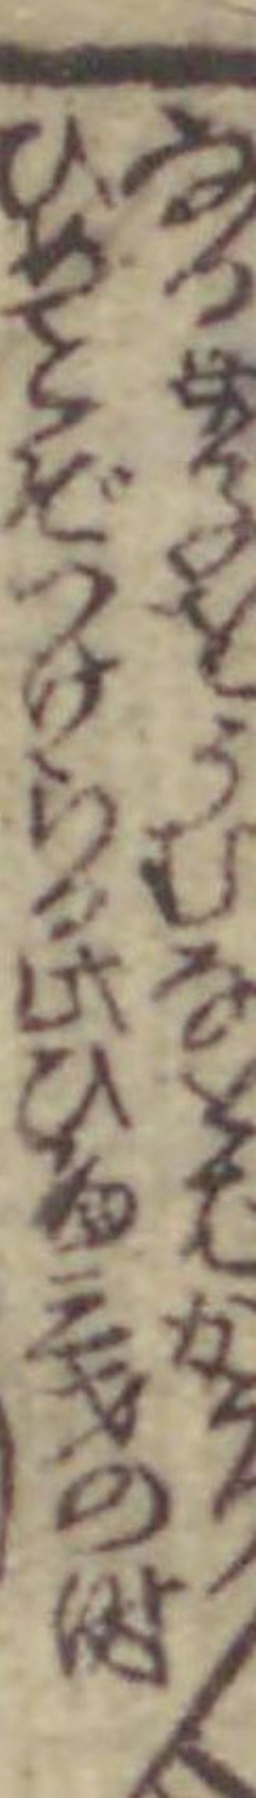ひめとぞつけらる此ひめ三才の時
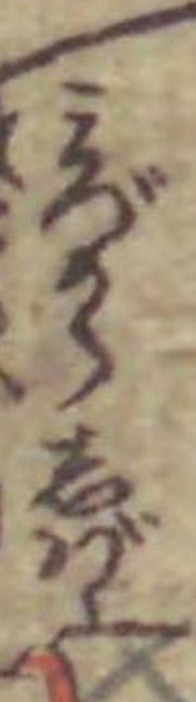みづからしばし
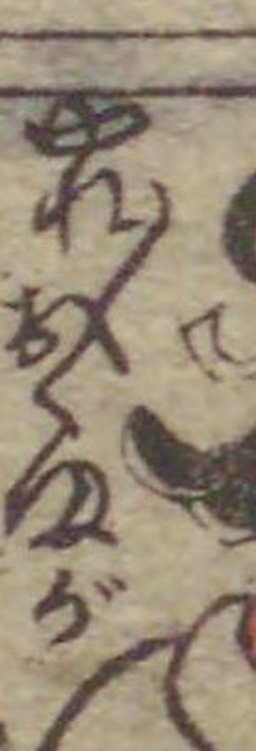やれ〳〵おく様が
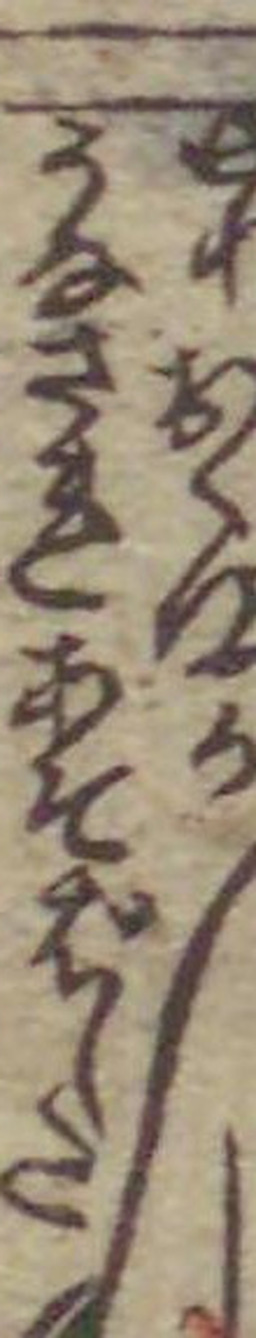うなされあそばした

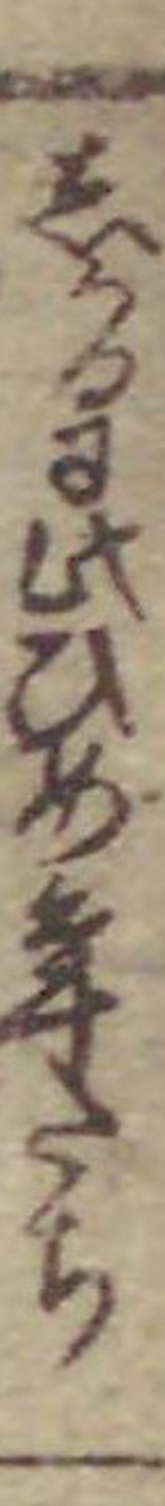しかるに此ひめ年たち
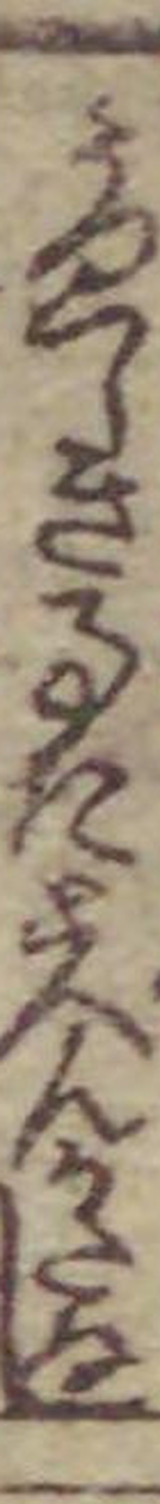うつくしき事たとへんかたなし
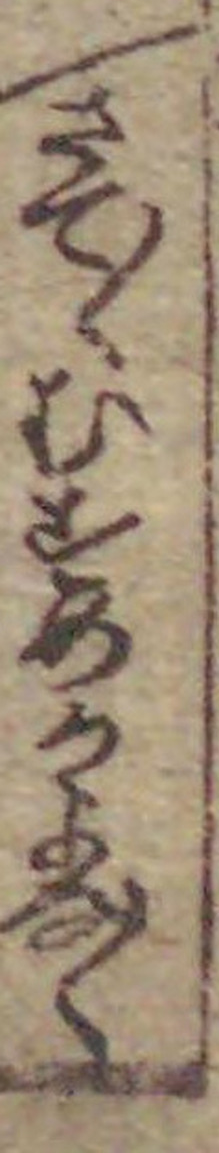さて〳〵むすめかよな〳〵
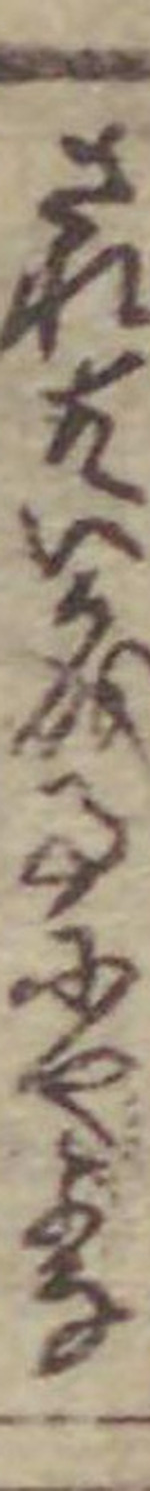され共いか成事にやよな
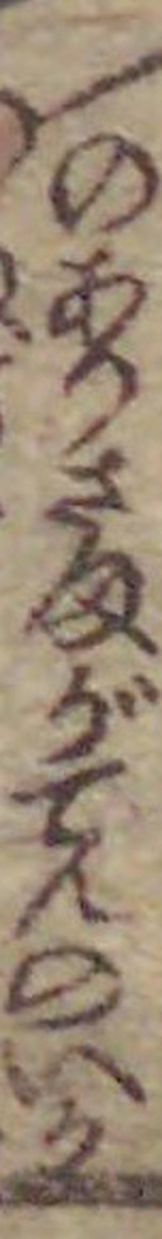のありさまがてんのいか
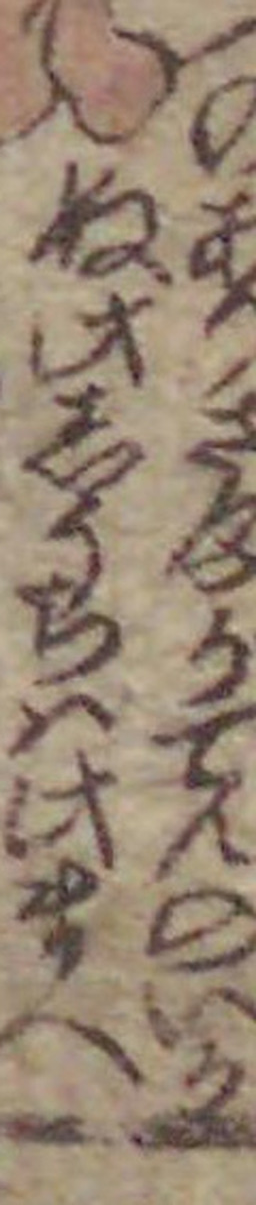ぬ此しうちは此まへ
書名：娜二代鉢木 5巻
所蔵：国立国会図書館 National Diet Library, JAPAN
